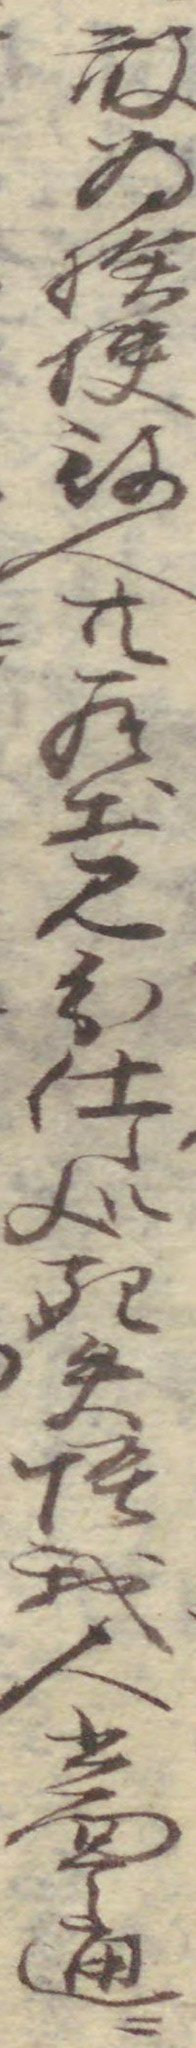敢為検使役人共罷出見分仕候処死失怪我人書面之通ニ
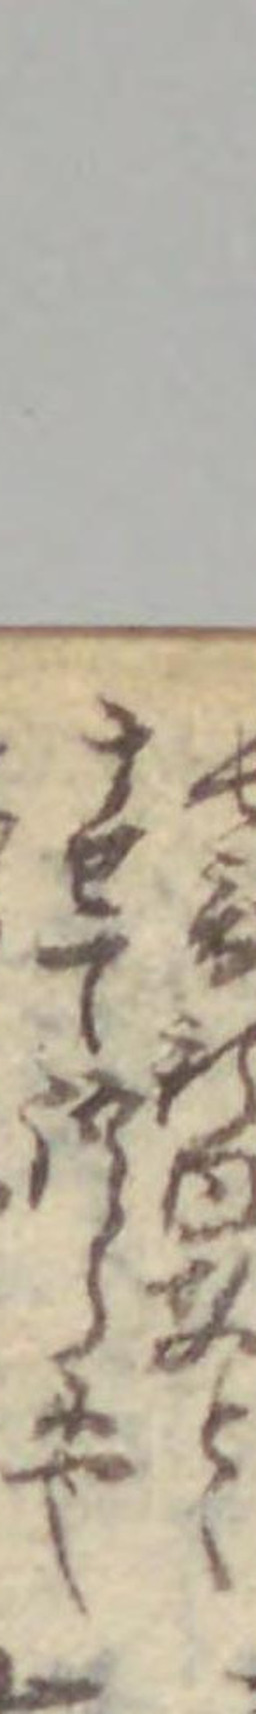ませて語らにや
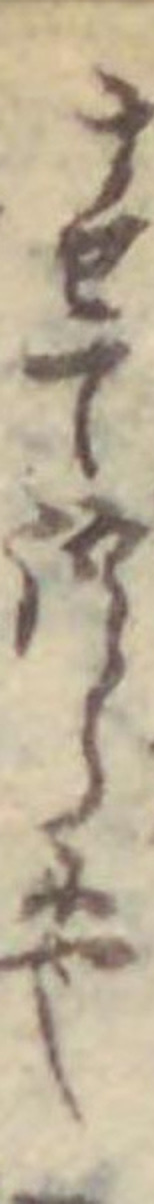ませて語らにや
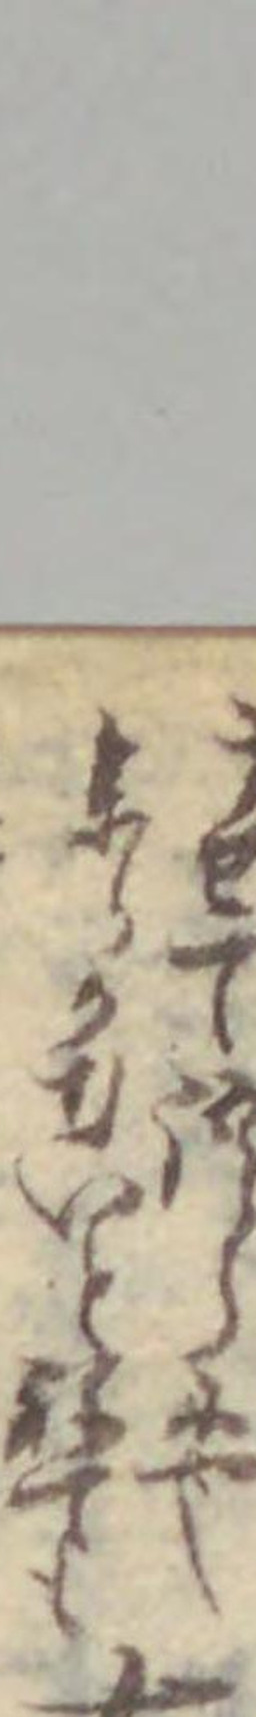参りかないとねても
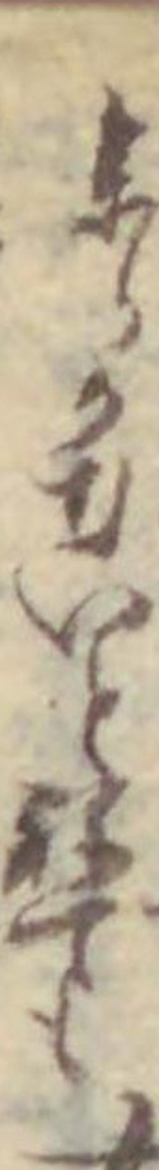参りかないとねても
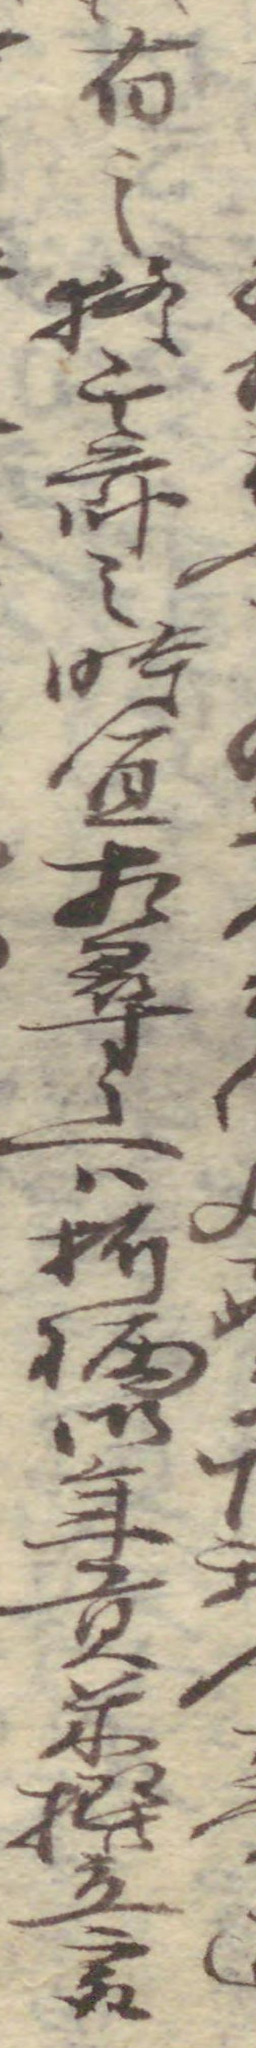有之猶其節之時宜相尋候へハ折柄御年貢米選立最
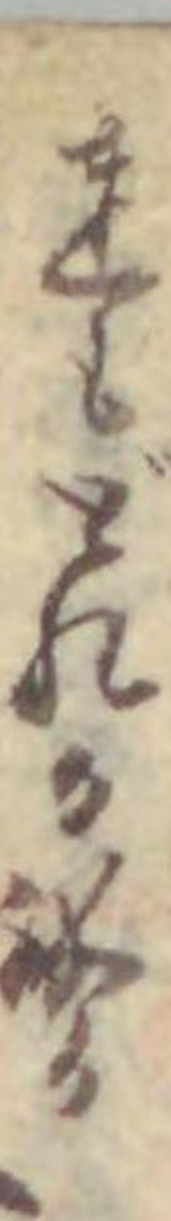達もどれか誠か
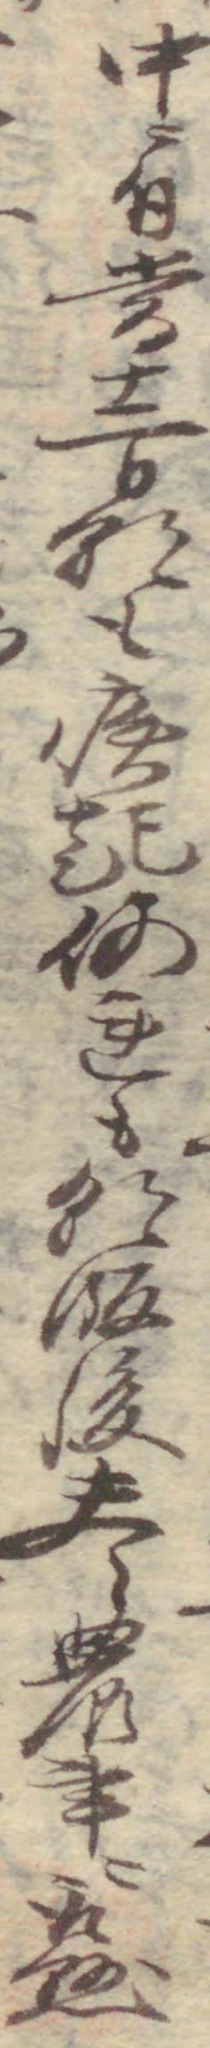中ニ付当十二日朝も疾起何れも朝飯後夫〻農事ニ取懸
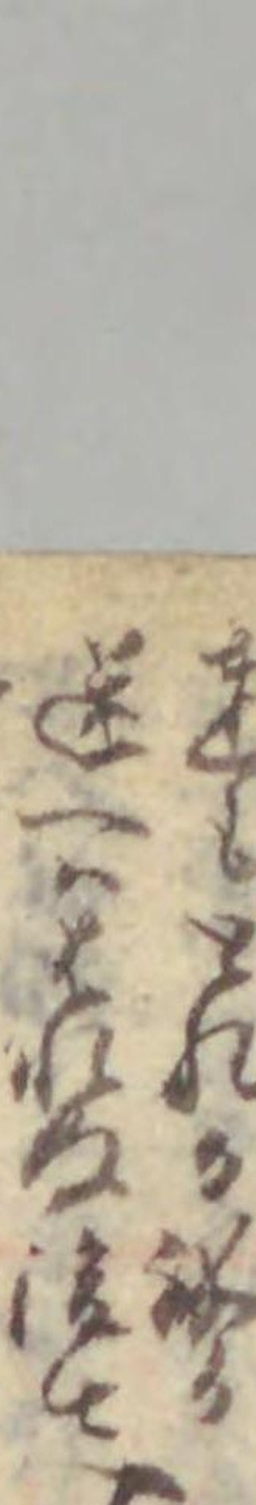迷へははれぬ後生
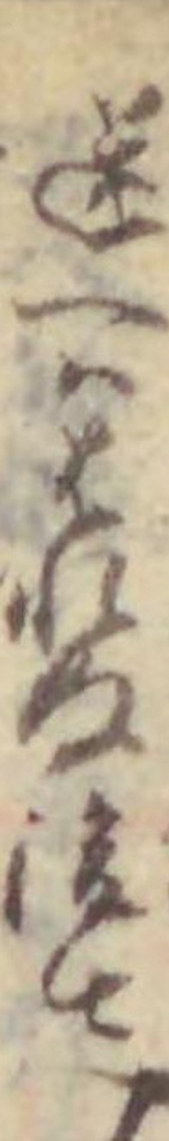迷へははれぬ後生
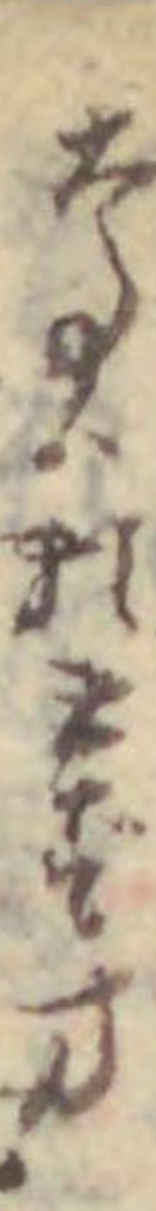大事ハ頼まず方
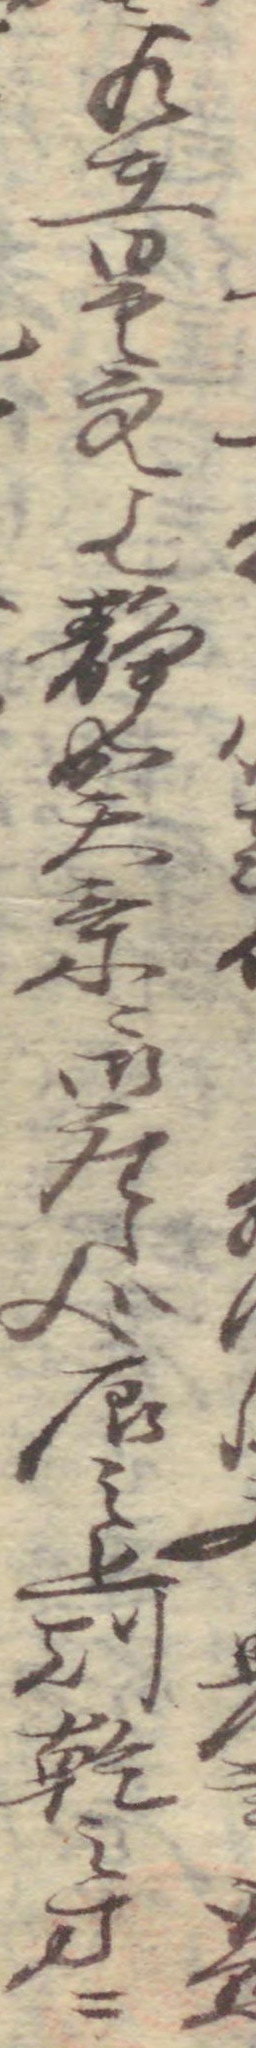罷在曇空ニて静成天気ニ御座候処辰之上刻乾之方ニ
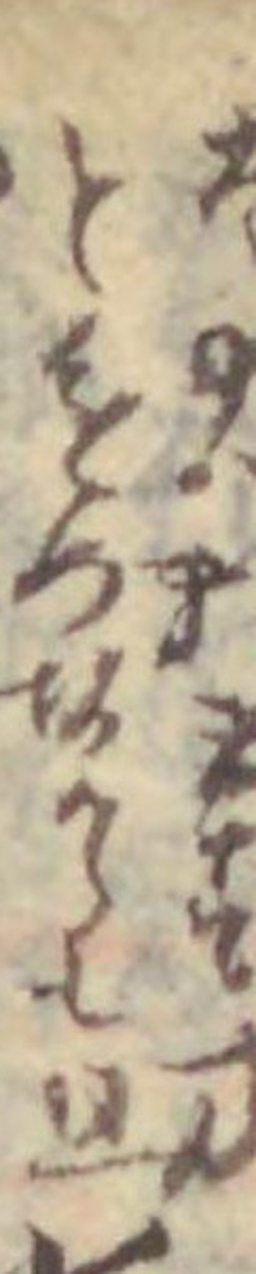と進めなからも旦
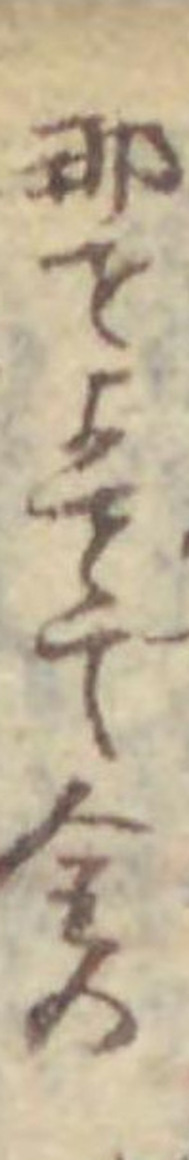那をよせて金の
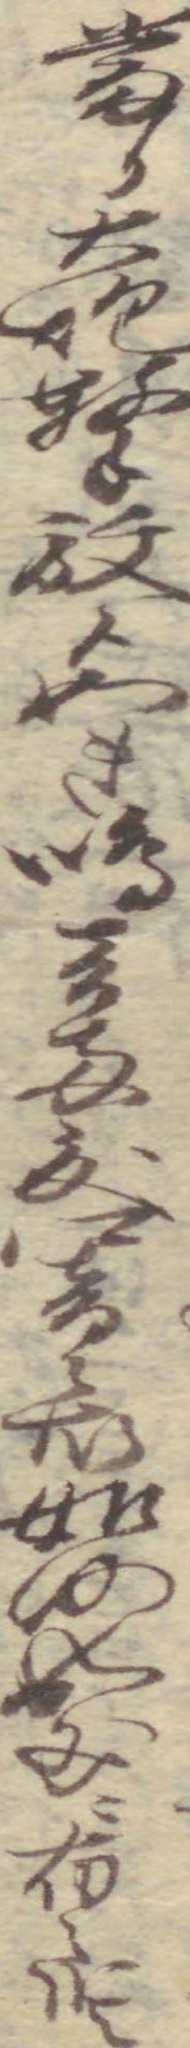当り大炮撃放候如き鳴音両度響候故如何成義ニ有之哉
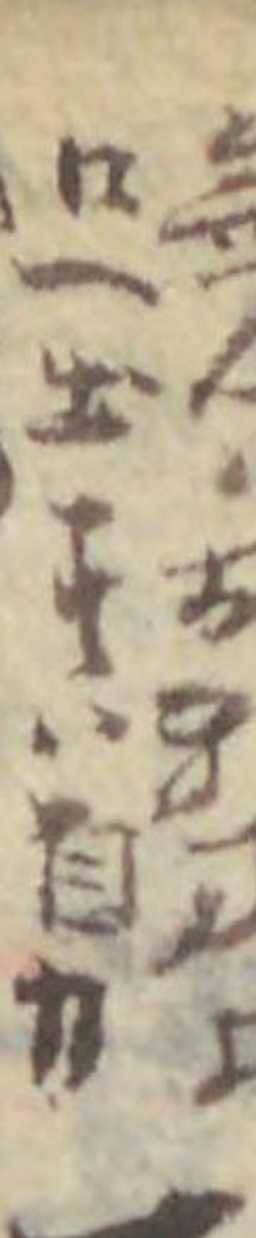口へ出すハ自力
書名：鶯宿雑記. 巻199-200
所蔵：国立国会図書館 National Diet Library, JAPAN
